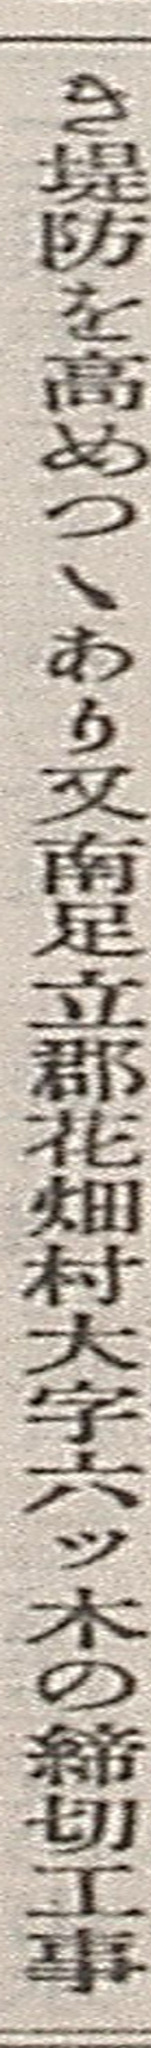き堤防を高めつゝあり又南足立郡花畑村大字六ツ木の締切工事
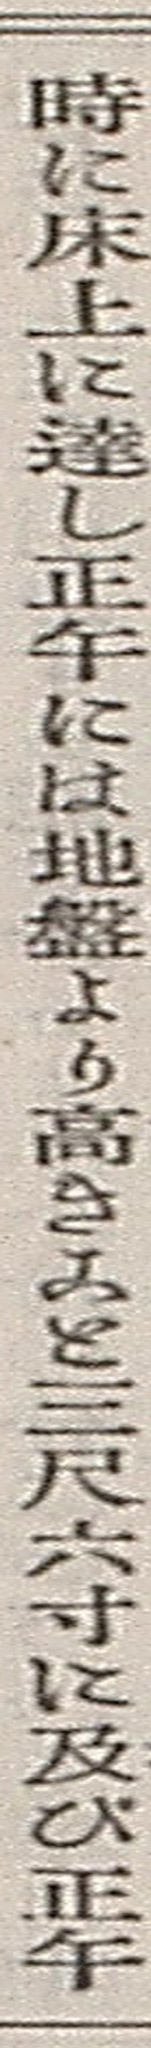時に床上に達し正午には地盤より高きこと三尺六寸に及び正午
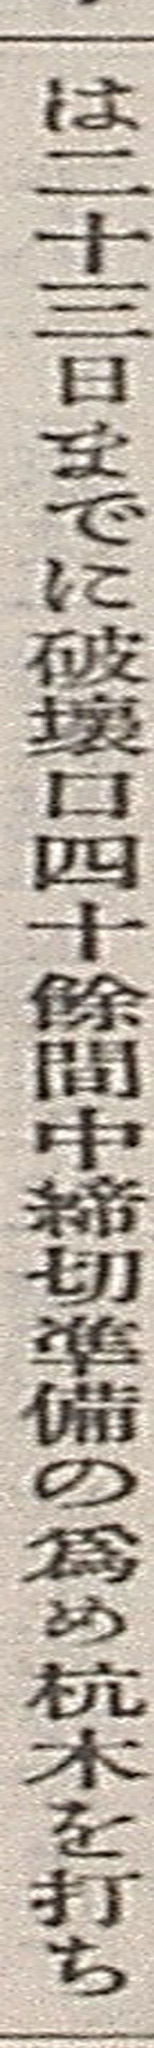はニ十三日までに破壊口四十余間中締切準備の為め杭木を打ち
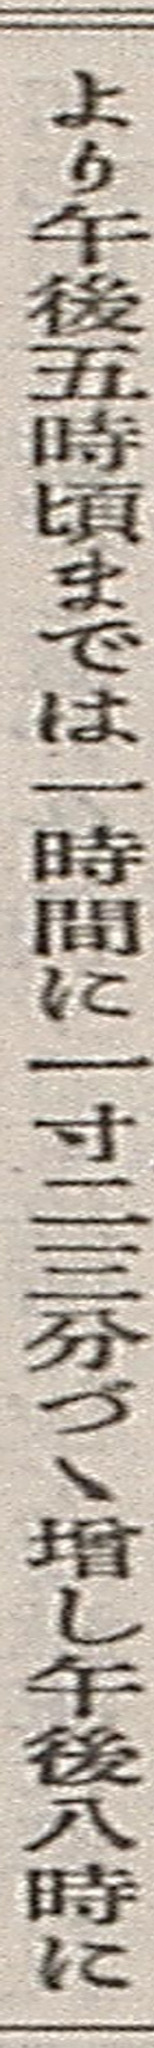より午後五時頃までは一時間に一寸二三分づゝ増し午後八時に
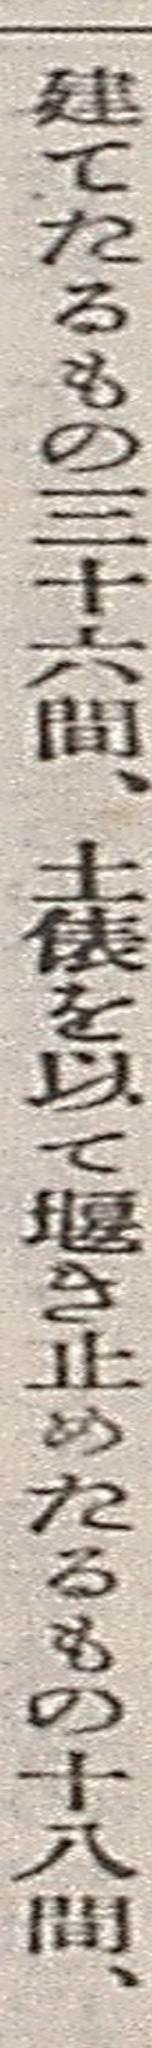建てたるもの三十六間、土俵を以て堰き止めたるもの十八間、
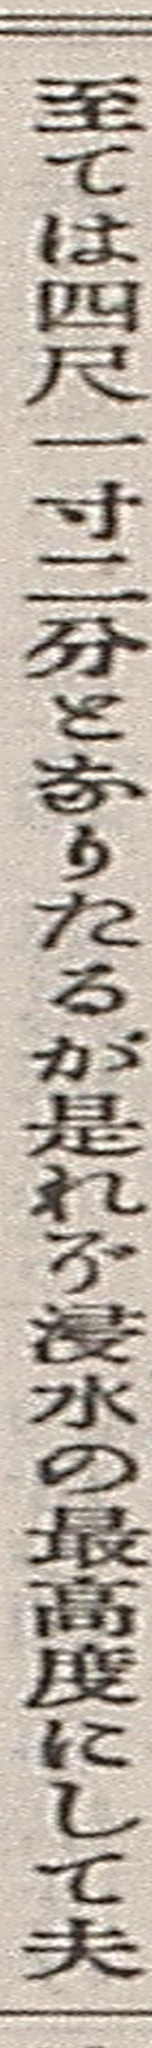至ては四尺一寸ニ分となりたるが是れが浸水の最高度にして夫
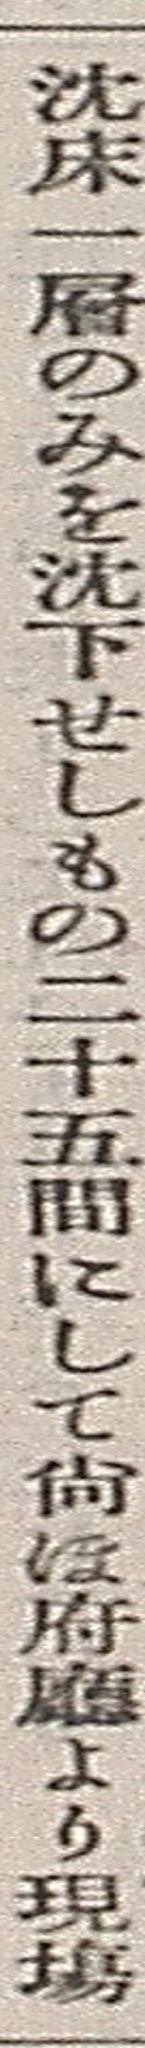沈床一層のみを沈下せしもの二十五間にして尚ほ府庁より現場
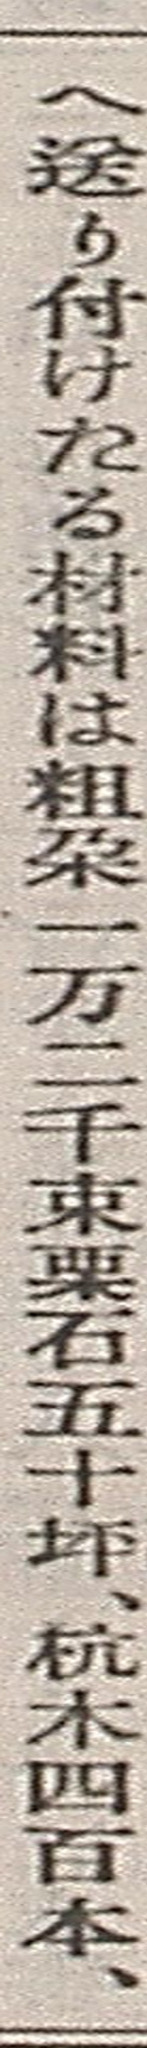へ送り付けたる材料は粗朶一万ニ千束栗石五十坪、杭木四百本、
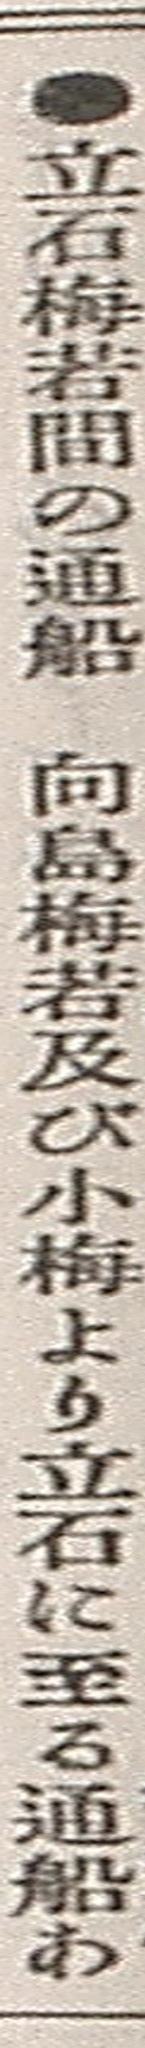●立石梅若間の通船向島梅若及び小梅より立石に至る通船あ
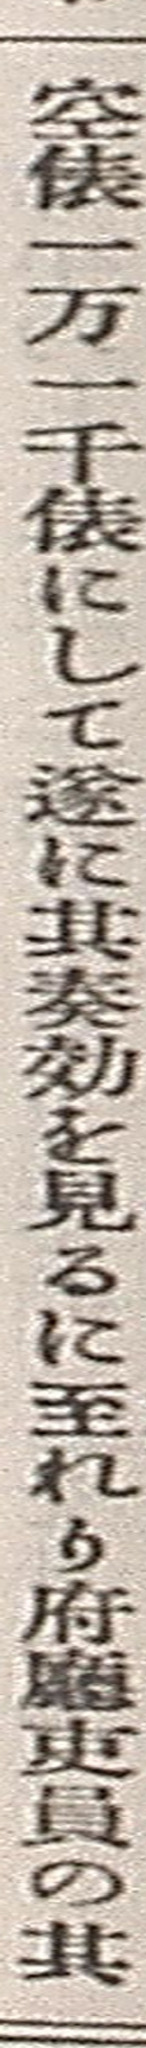空俵一万一千俵にして遂に其奏功を見るに至れり府庁吏員の其
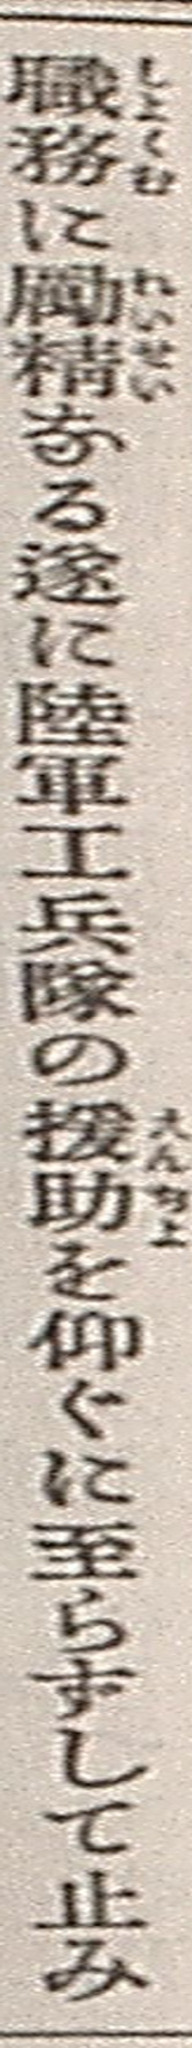職務に励精なる遂に陸軍工兵隊の援助を仰ぐに至らずして止み
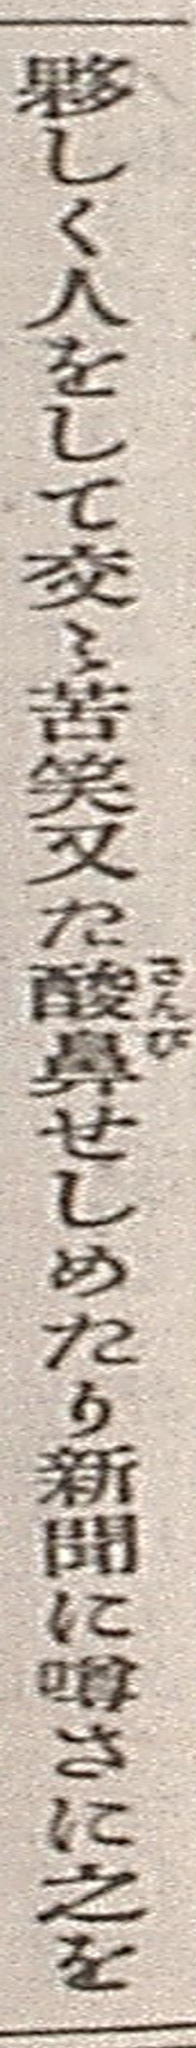夥しく人をして交々苦笑又た酸鼻せしめたり新聞に噂さに之を
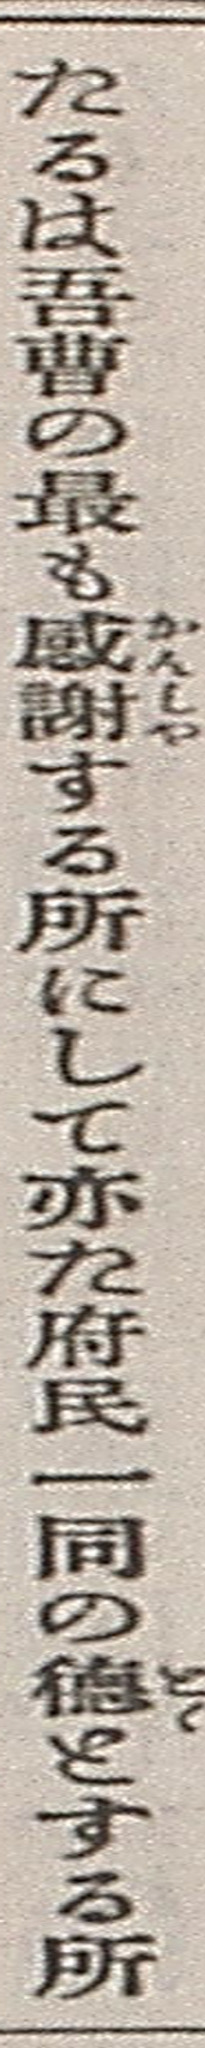たるは吾曹の最も感謝する所にして亦た府民一同の徳とする所
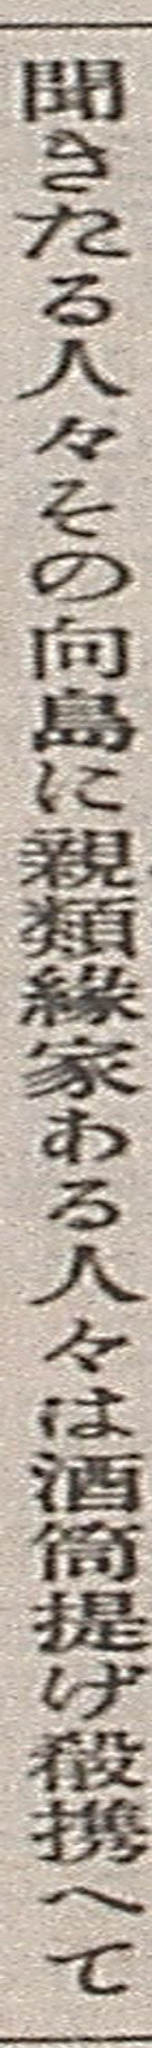聞きたる人々その向島に親類縁家ある人々は酒筒提げ殽携へて
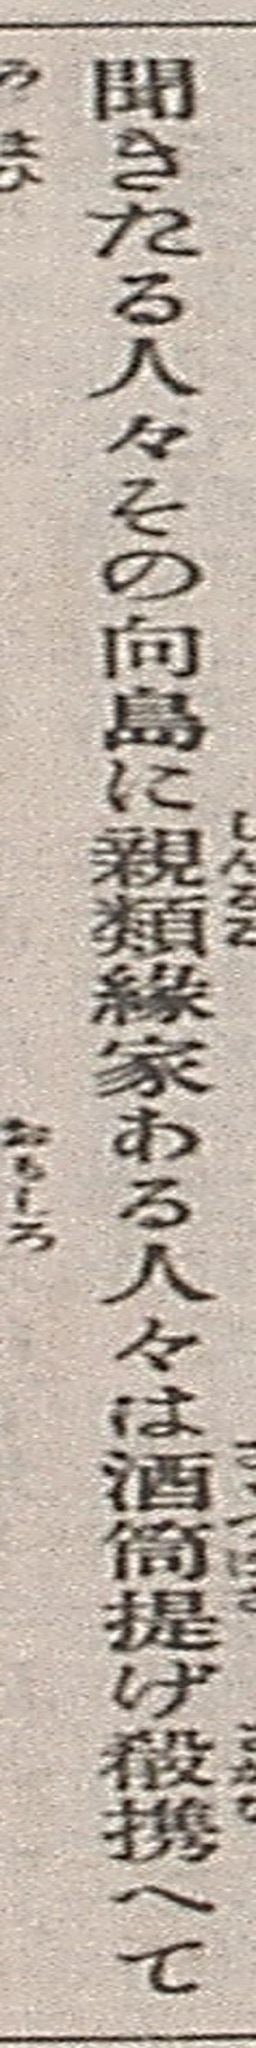聞きたる人々その向島に親類縁家ある人々は酒筒提げ殽携へて
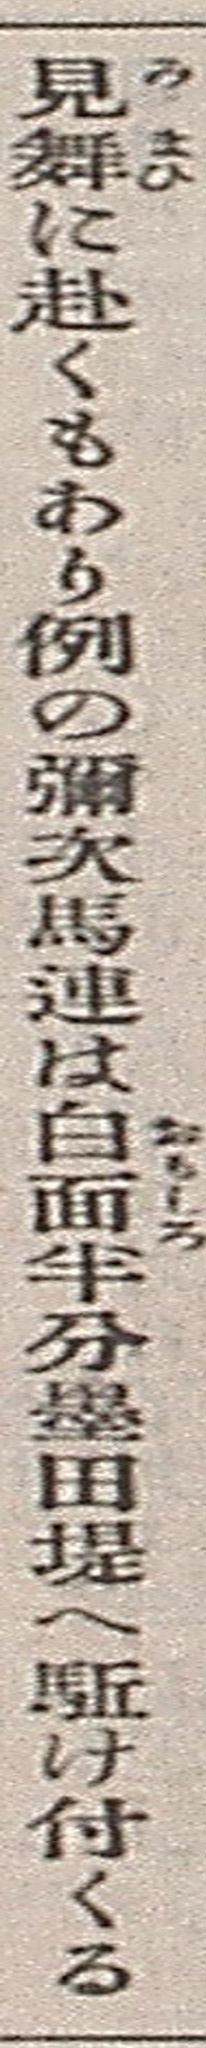見舞に赴くもあり例の弥次馬連は面白半分隅田堤へ駈け付くる
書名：風俗畫報臨時増刊第百二十四號　洪水地震被害録（上）
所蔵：東京大学地震研究所図書室 Earthquake Research Institute Library, The University of Tokyo, JAPAN
